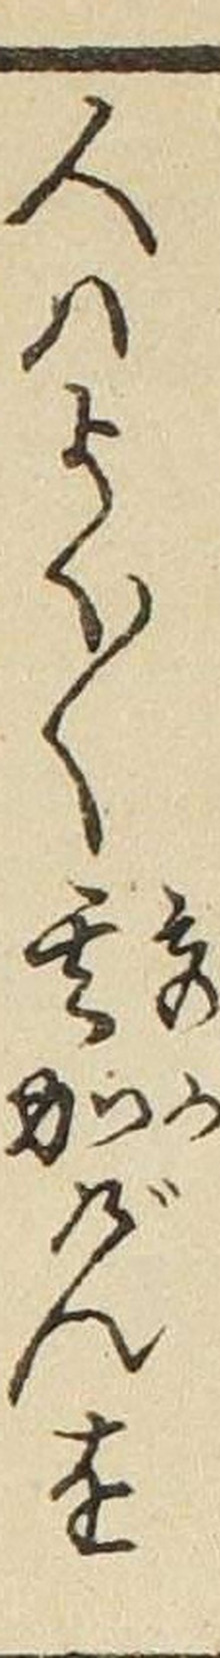人はよく〳〵其加げんを
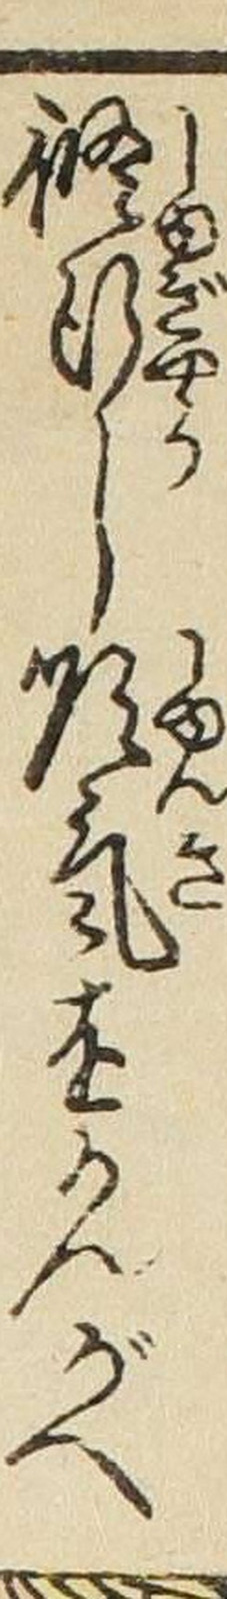修行し順気をかんがへ
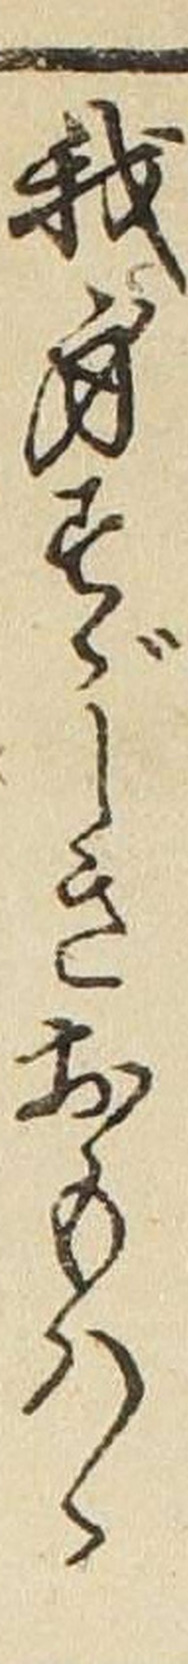我身すゞしきおもはゝ
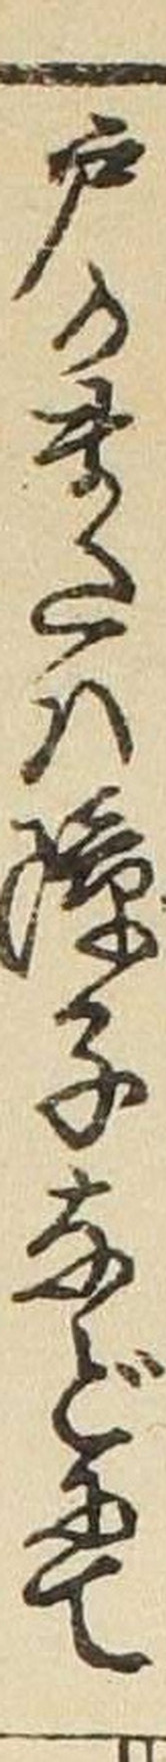戸かまたは障子などにて
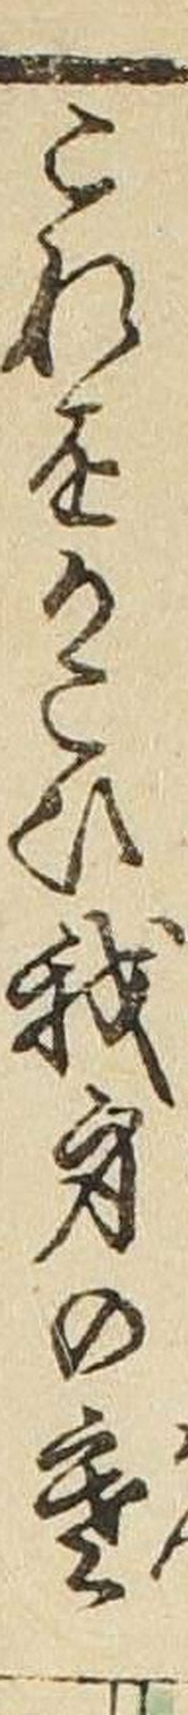これをかこひ我身の寒
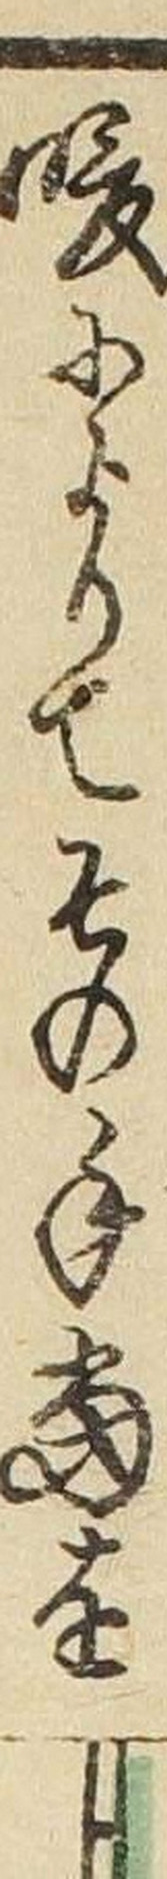暖によりてその手当を
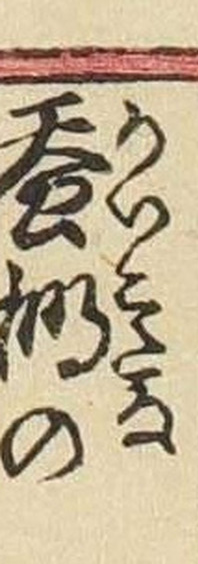蚕棚の
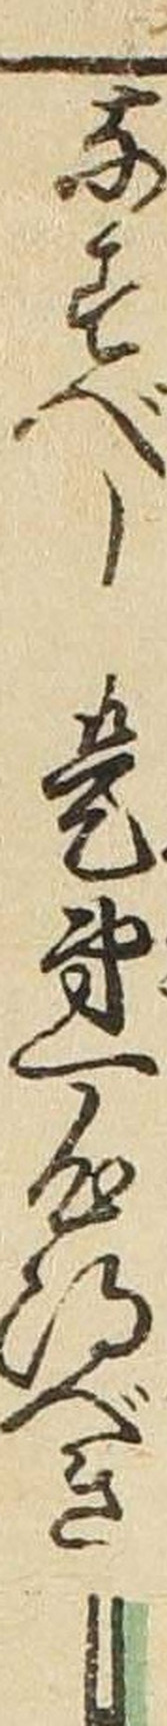なすべし是第一心得べき
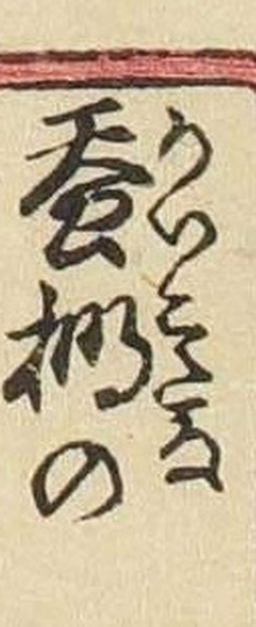蚕棚の
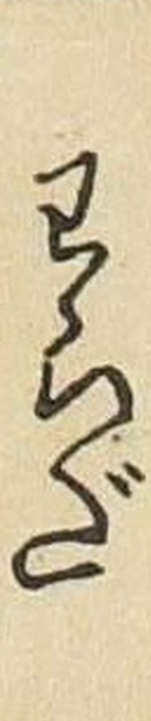わらだ
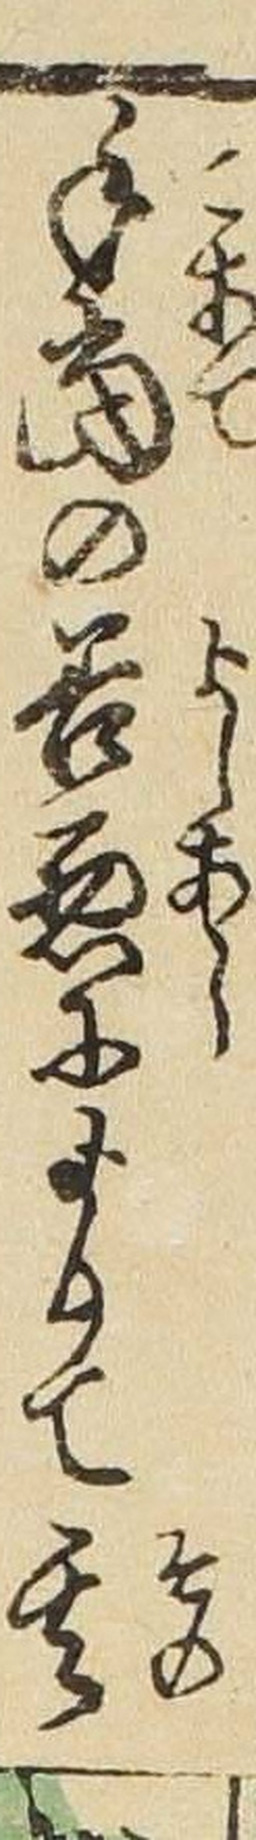手当の善悪によりて其
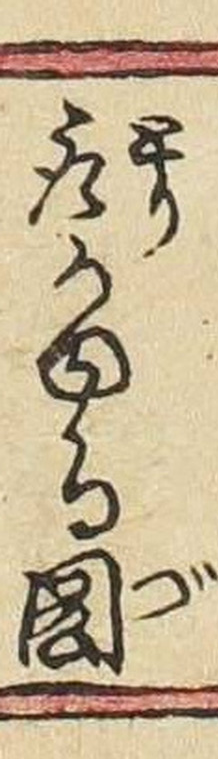取かゆる図
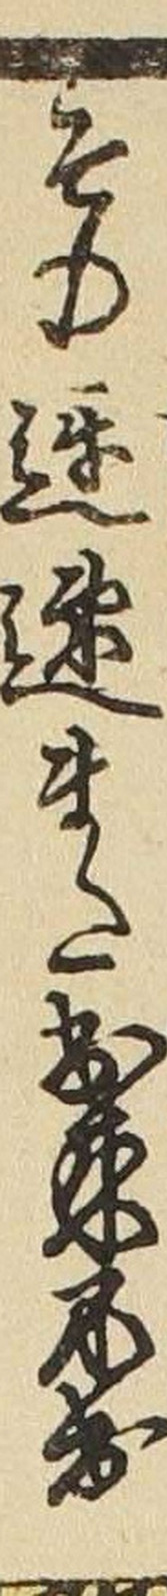その遅速また出来不出
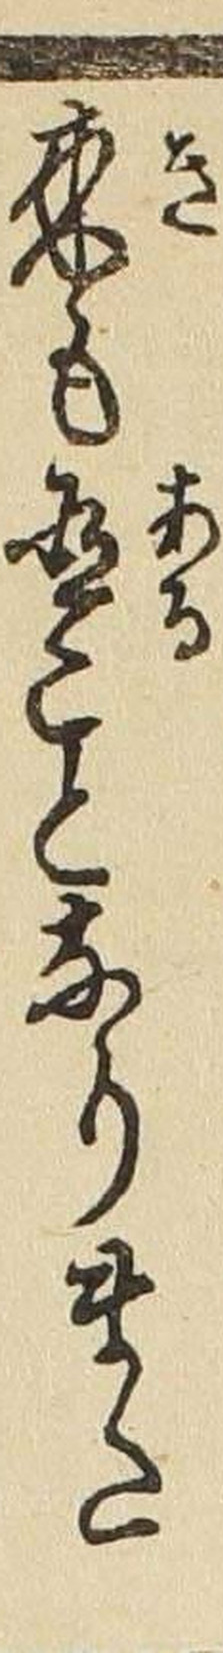来も有ことなりまた
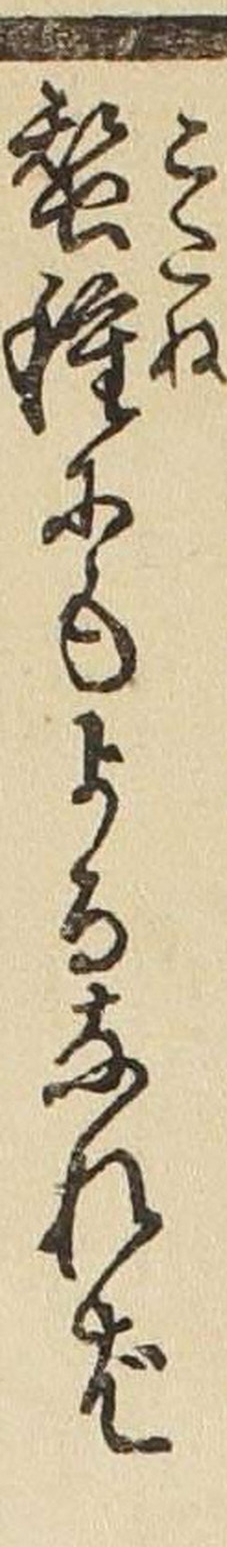蚕種にもよるなれば
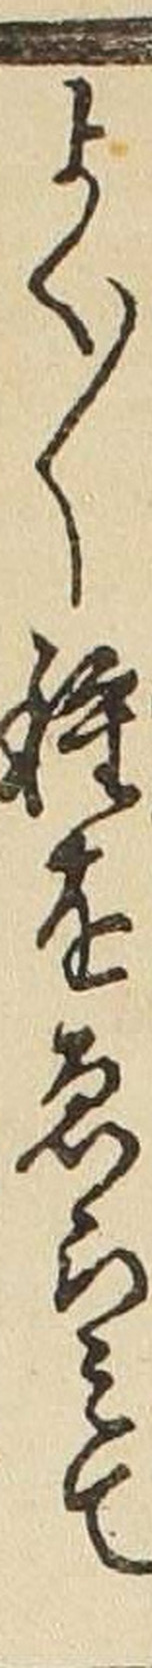よく〳〵種をゑらみて
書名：養蠶圖解
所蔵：東京大学農学生命科学図書館 国文学研究資料館
